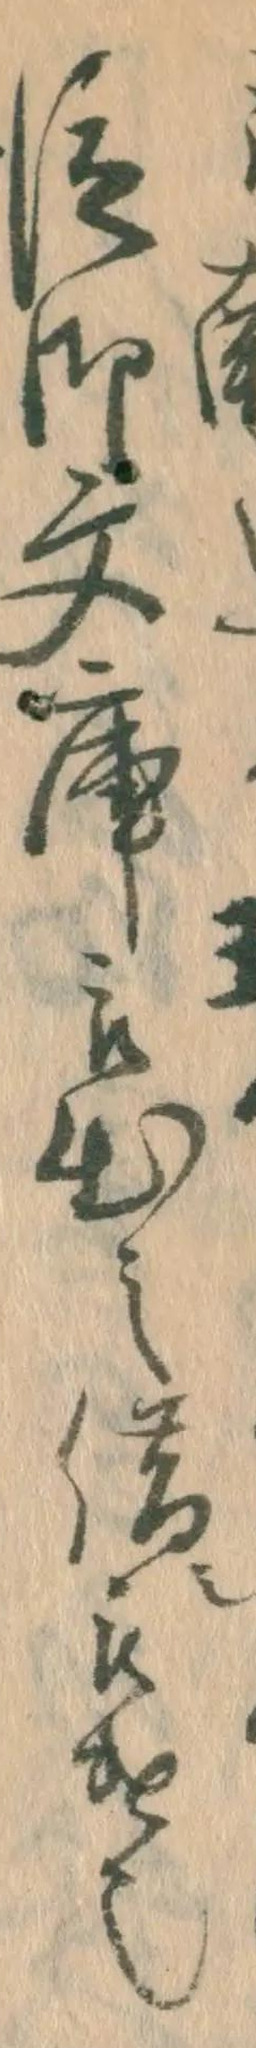従御文庫被出之借シ被遣候也
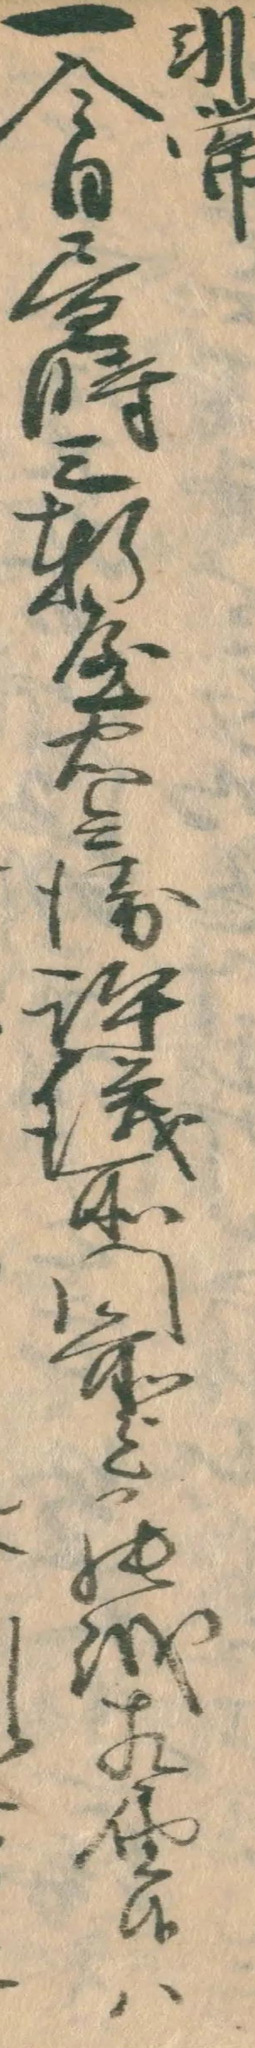一今日昼時三軒屋忠兵衛評議所門前迄罷越相届候ハ
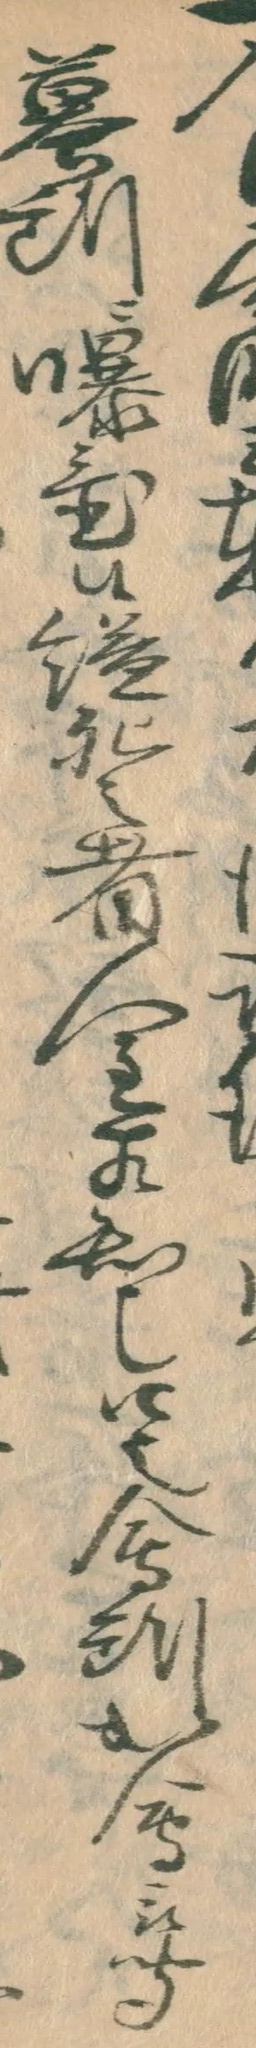墓所ニ曝置候縊死之者人主相知申候由也会所出会被聞
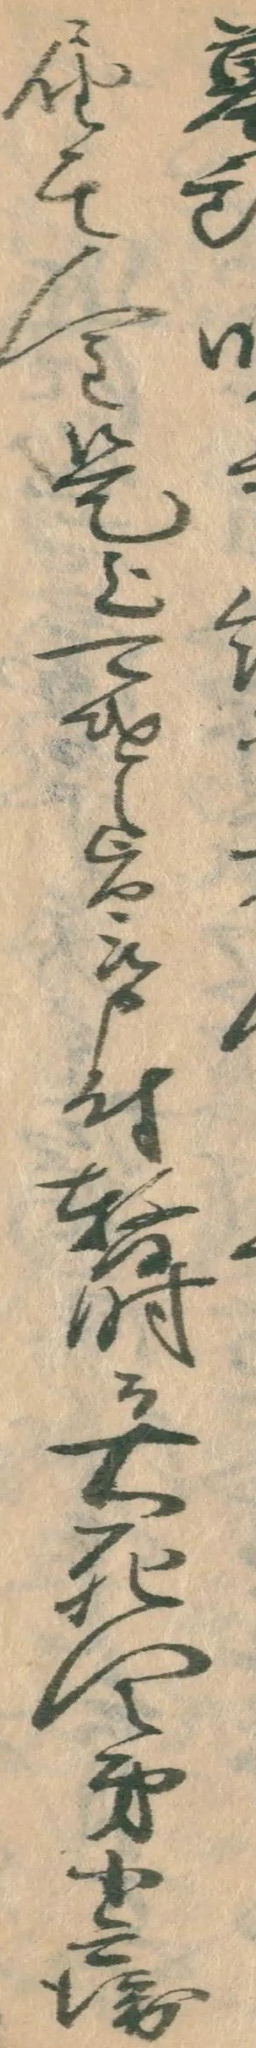届其人主是迄可遣候旨被申付暫時而右死人之弟小兵衛
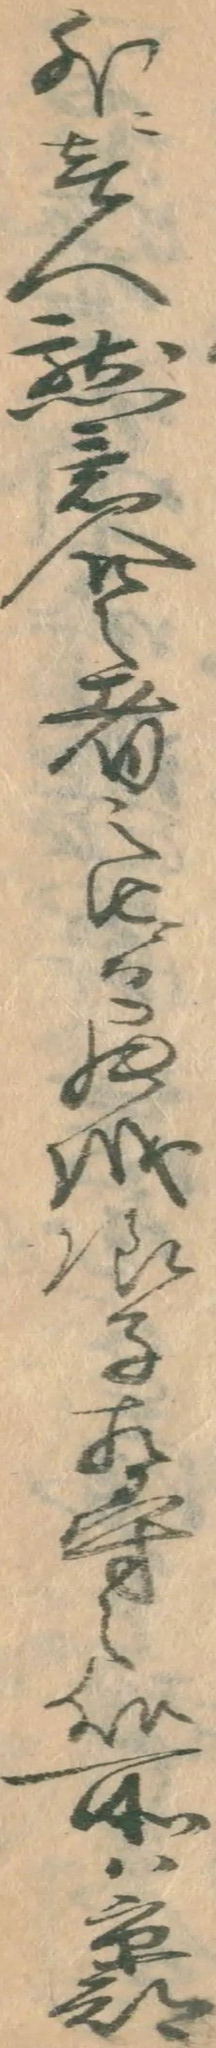外ニ壱人懇意合之者之由ニ而罷越様子相尋候趣所ハ京都

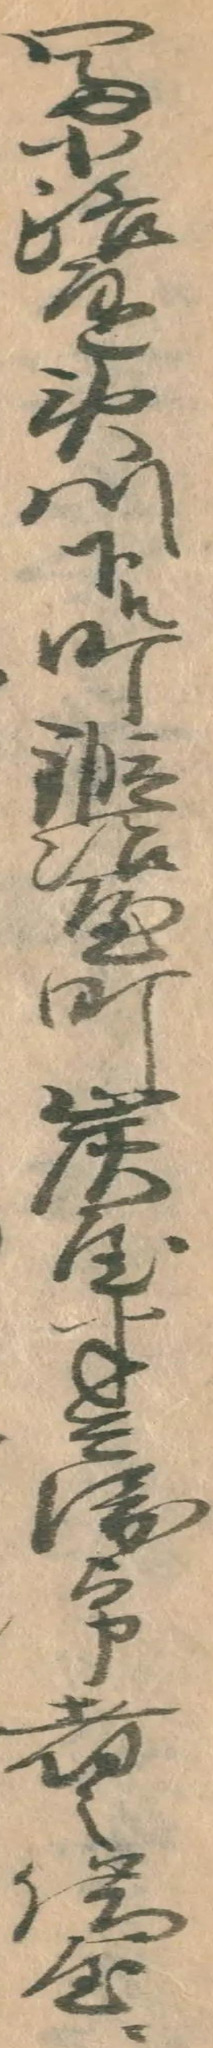富小路通夷川下ル町鍛冶屋町炭屋半兵衛与申者之借屋ニ
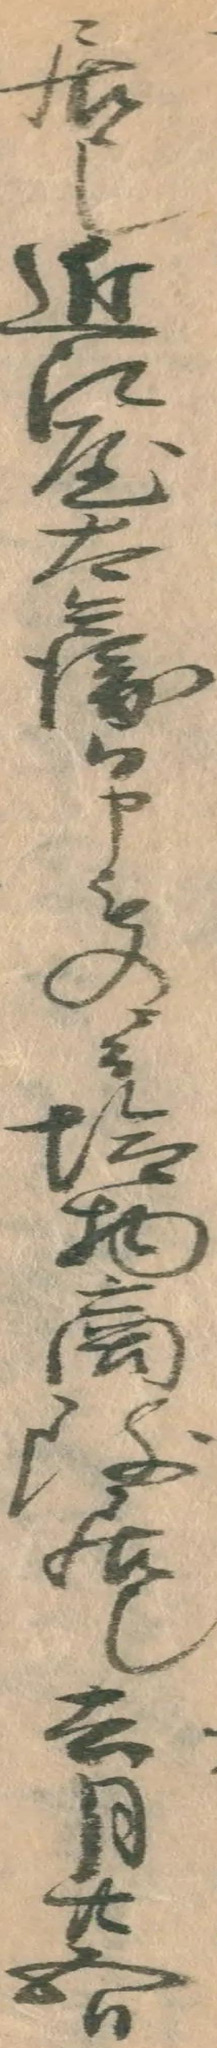居申候近江屋太兵衛与申ものニ而塩物商致居申候去月廿五日
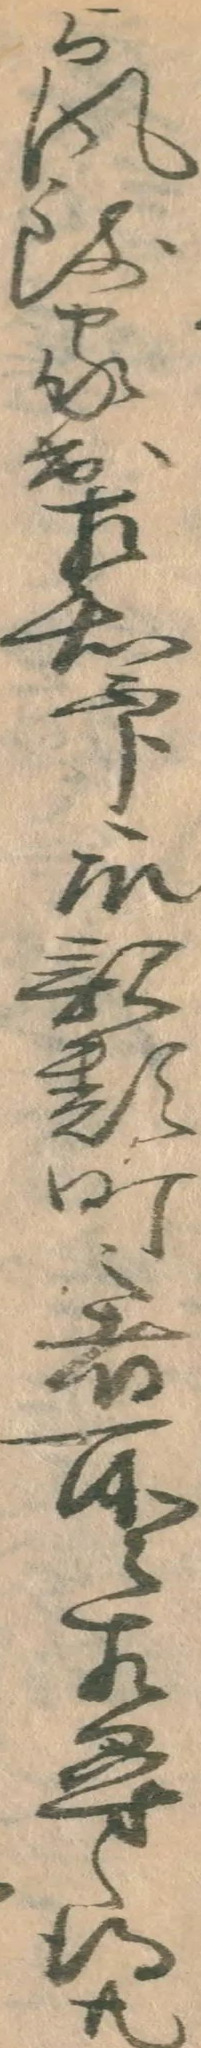与風致家出相知不申候故親類町之者所々相尋候得共
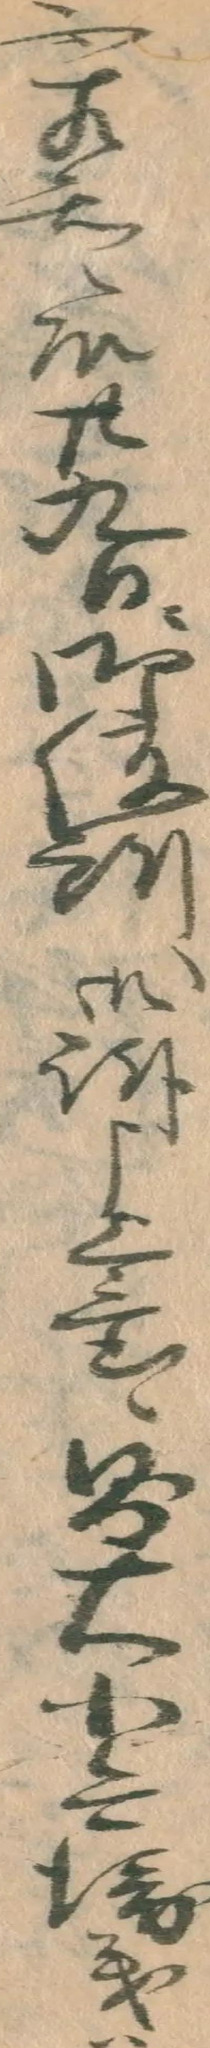不相知候故廿九日ニ御役所へ御訴申上置候則右小兵衛義ハ
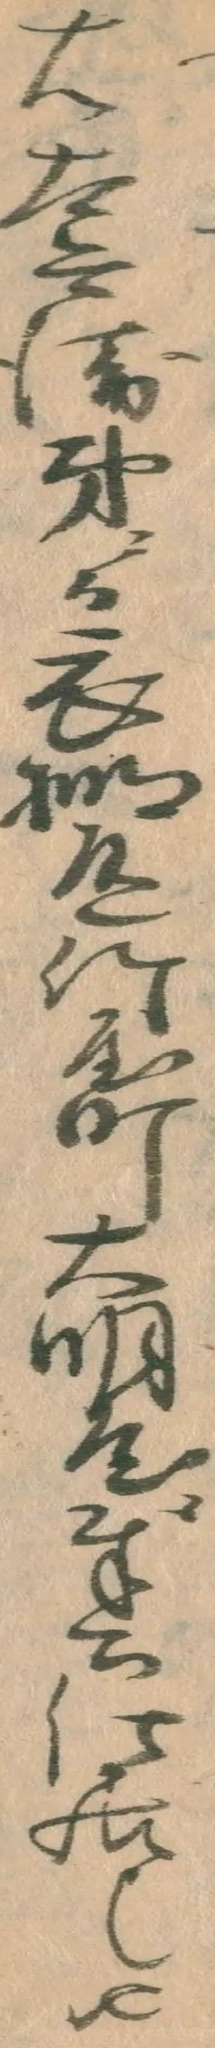右太兵衛弟ニ而衣棚通竹屋町大明屋ニ奉公仕居申候由
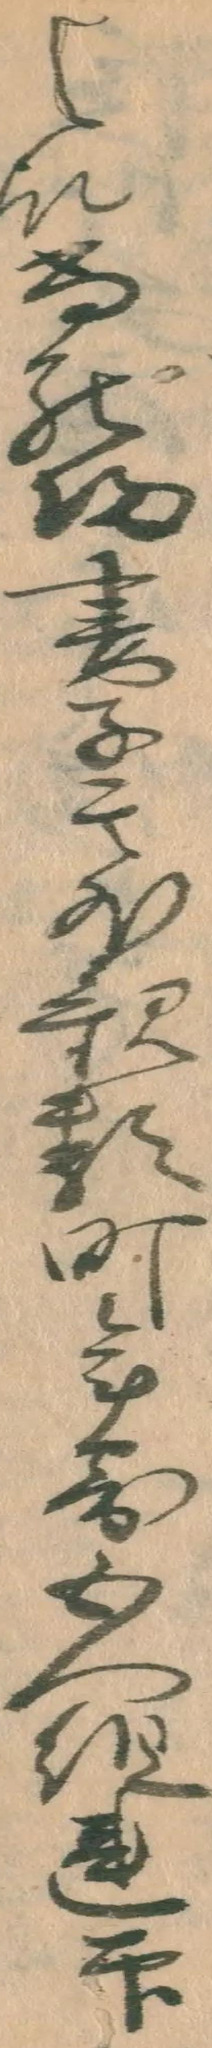申候故尚罷帰妻子其外親類町年寄五人組連印
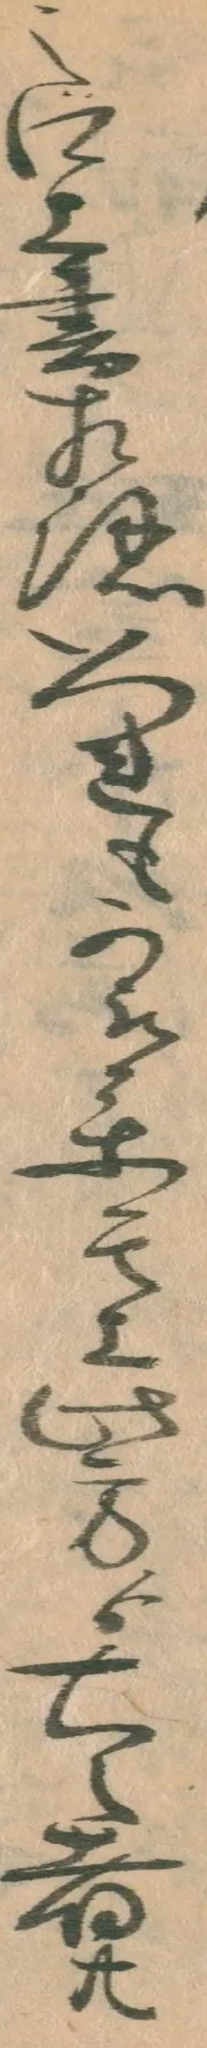之口上書相認いつれも可被参其上此方ゟ右之者共
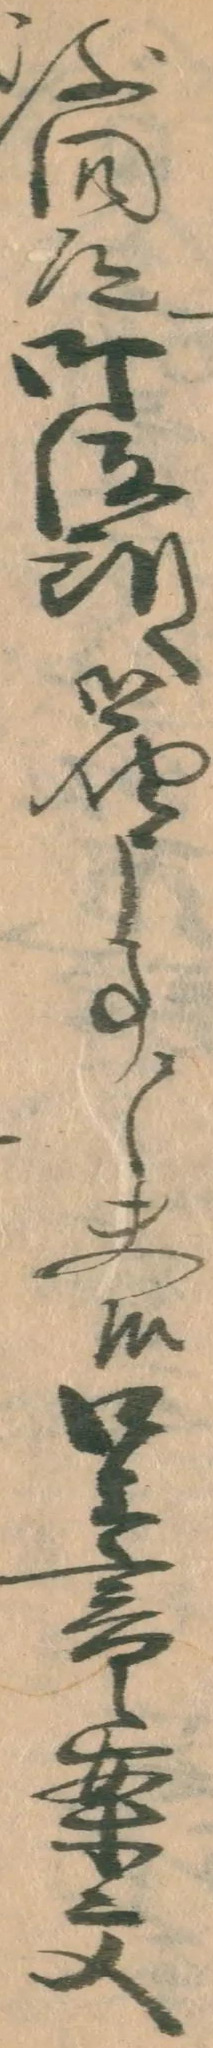致同道御役所へ御届申事ニ候夫故口上書之案文
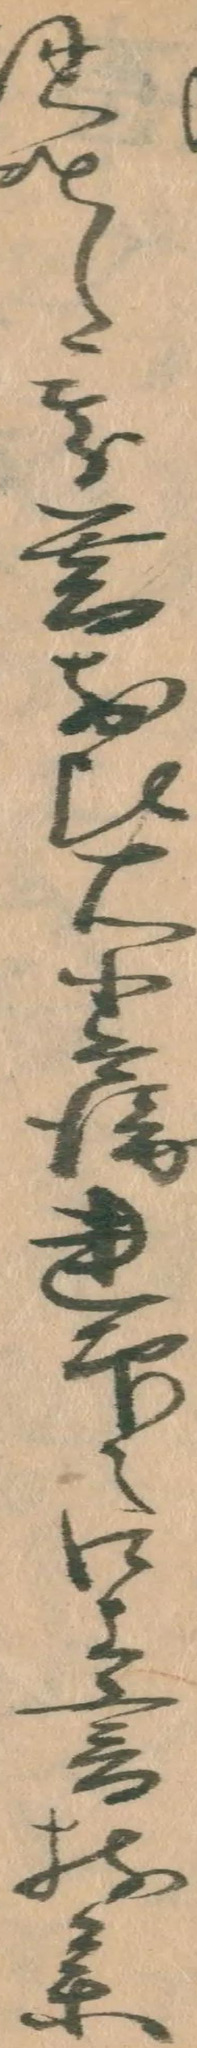認出し候処暮前比右小兵衛連印之口上書持参
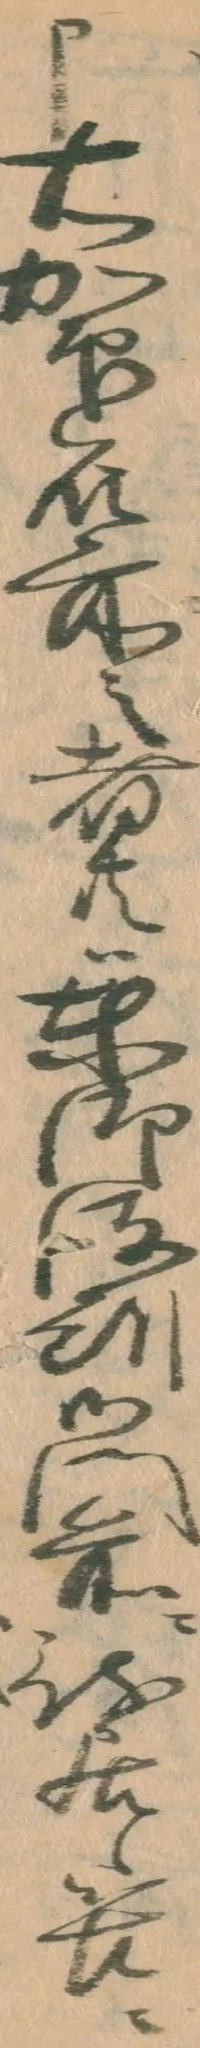申右加印前之者共ハ東御役所御門前ニ待居候筈ニ
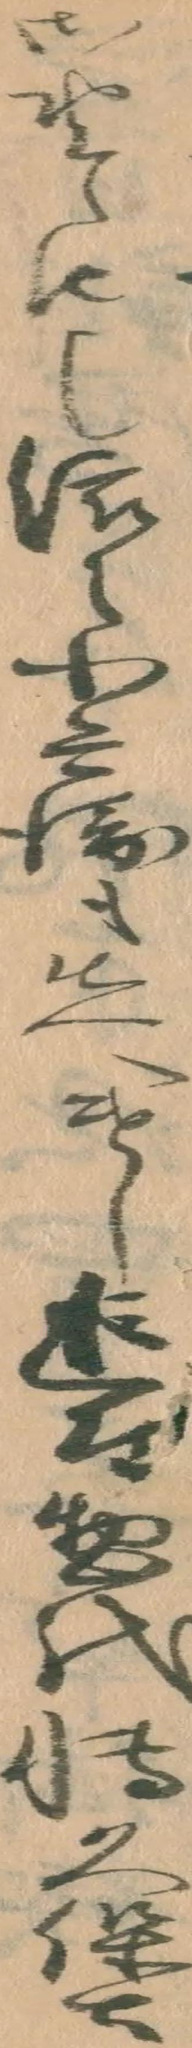御坐候由申候依之小兵衛も先へ遣し追付惣代博久保土
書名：賀茂社記録. 第60冊
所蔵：国立国会図書館 National Diet Library, JAPAN
